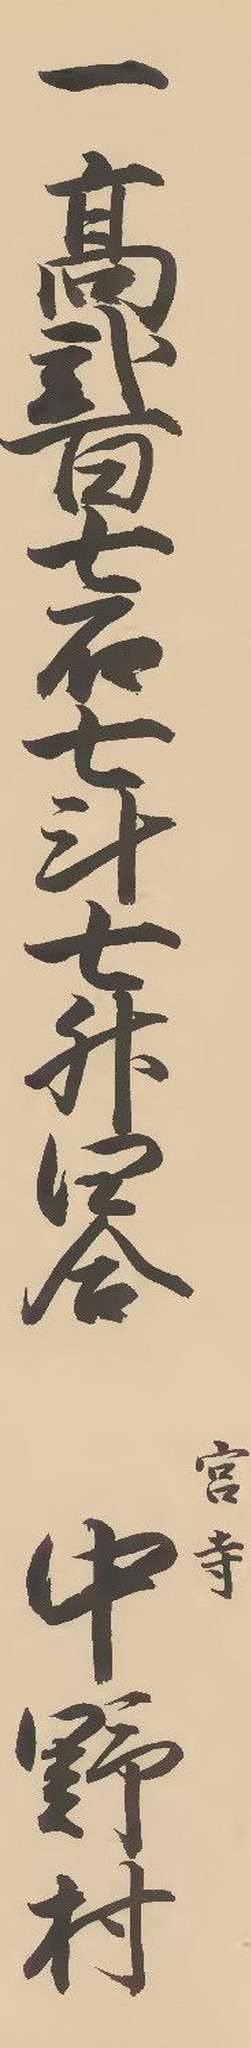一高弐百七石七斗七升四合中野村
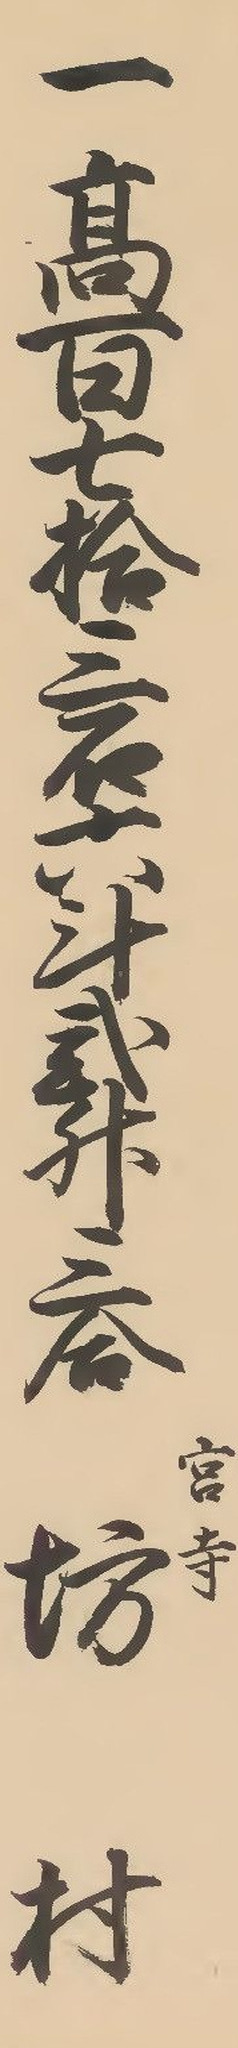一高百七拾三石六斗弐升三合坊村
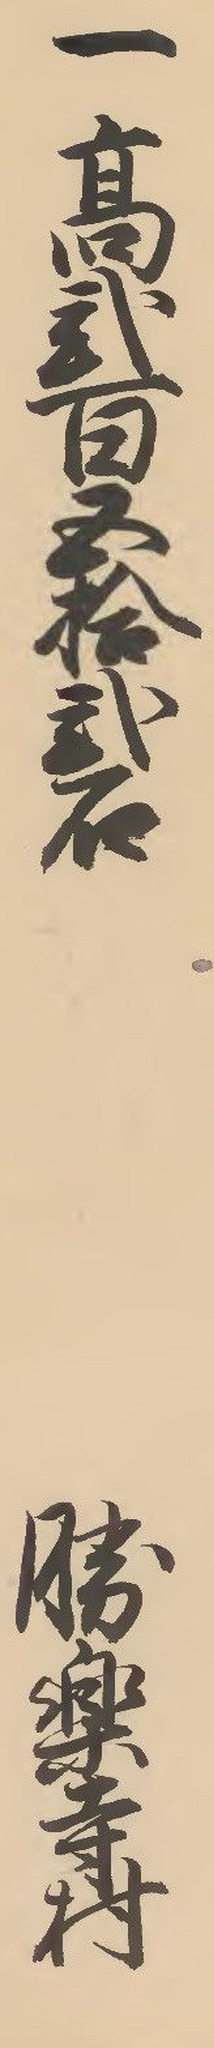一高弐百五拾弐石勝楽寺村

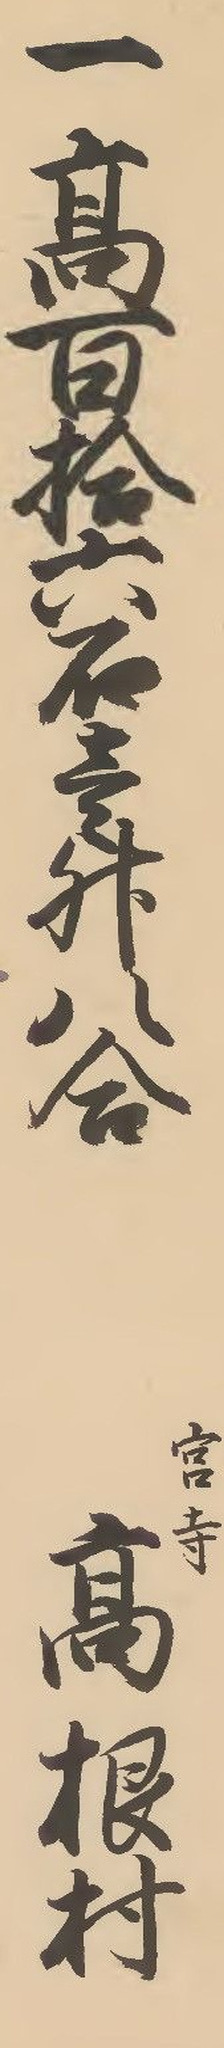一高百拾六石壱升八合高根村
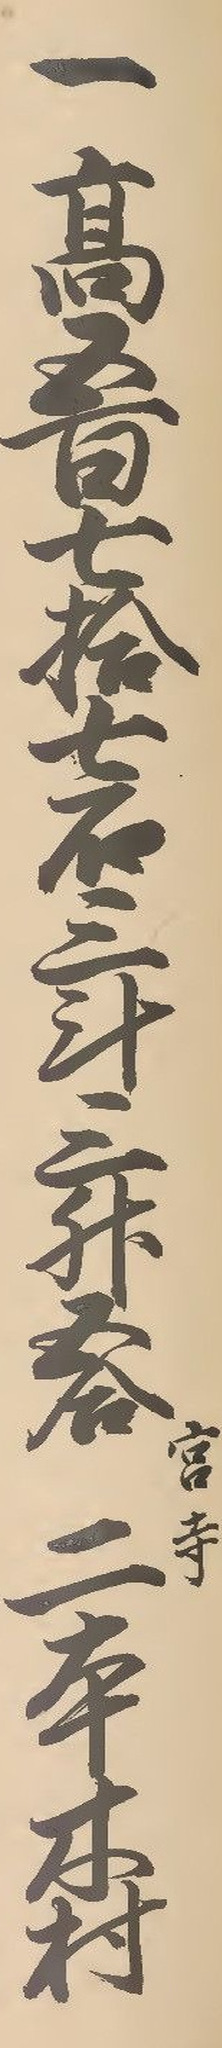一高五百七拾七石三斗三升五合二本木村
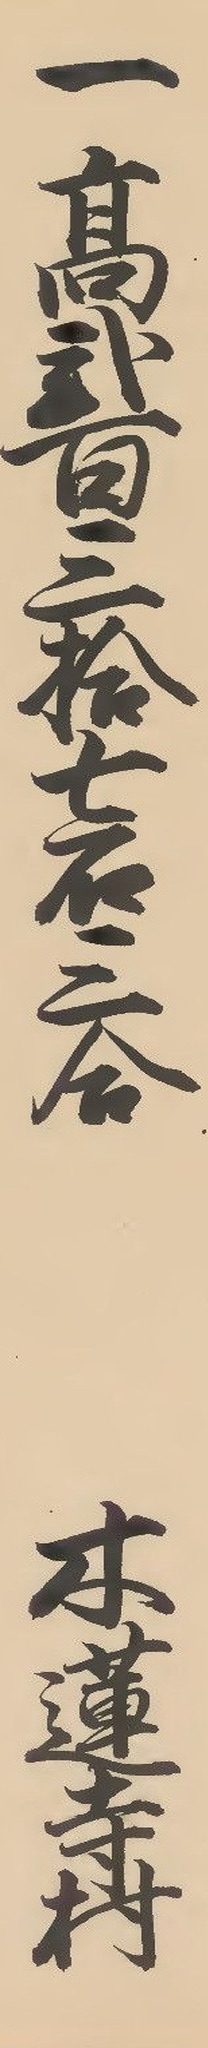一高弐百三拾七石三合木蓮寺村
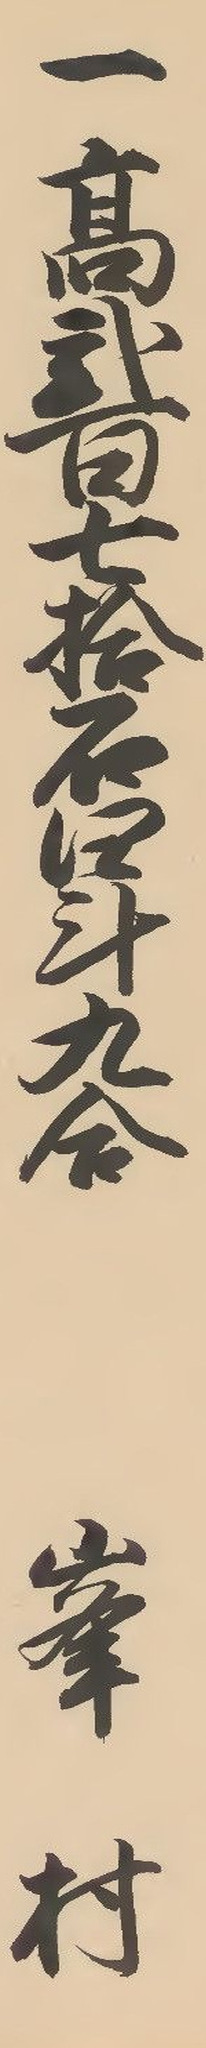一高弐百七拾石四斗九合峯村
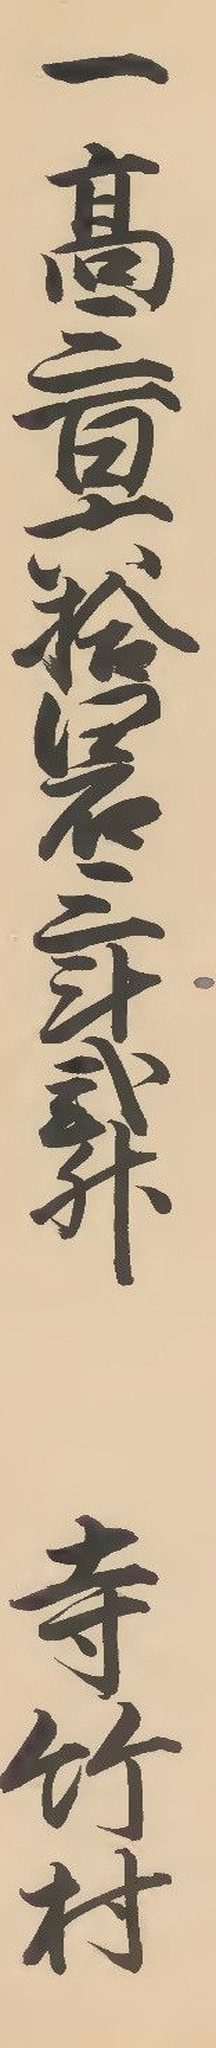一高三百六拾四石三斗弐升寺竹村

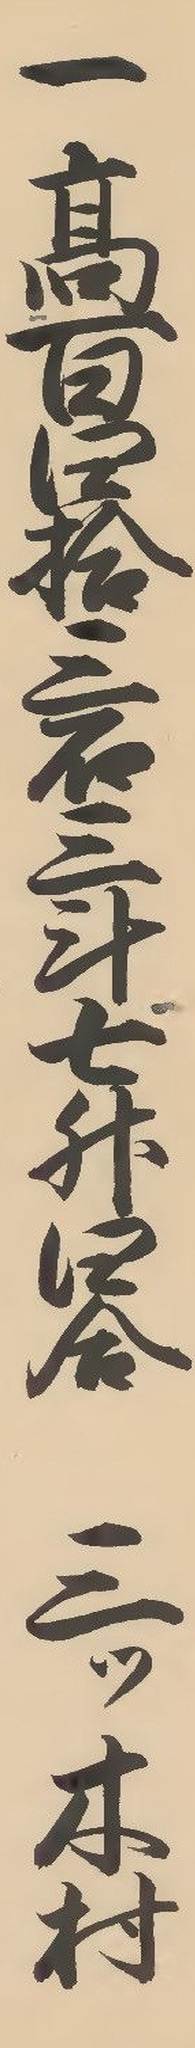一高百四拾三石三斗七升四合三ッ木村
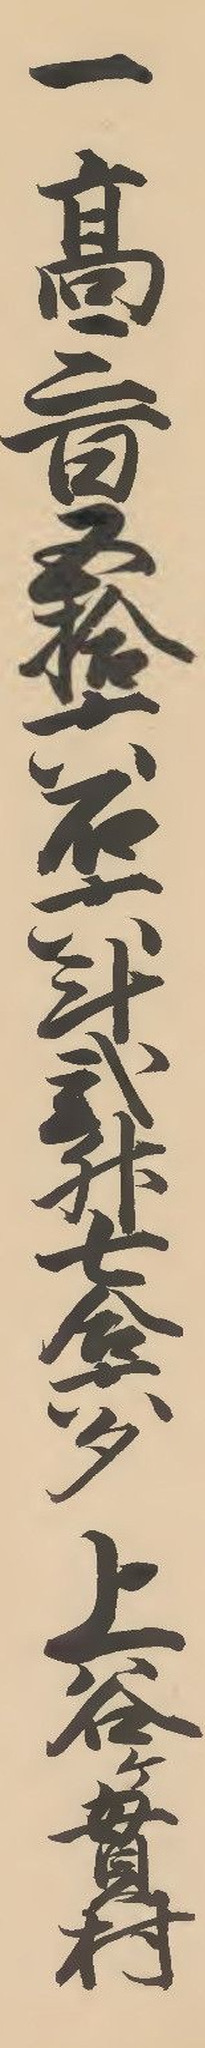一高三百五拾六石六斗弐升七合六勺上谷ヶ貫村
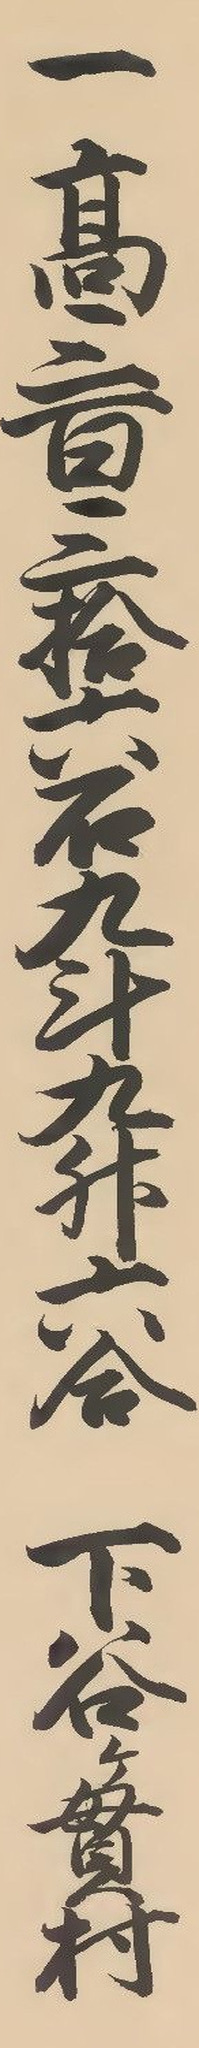一高三百三拾六石九斗九升六合下谷ヶ貫村
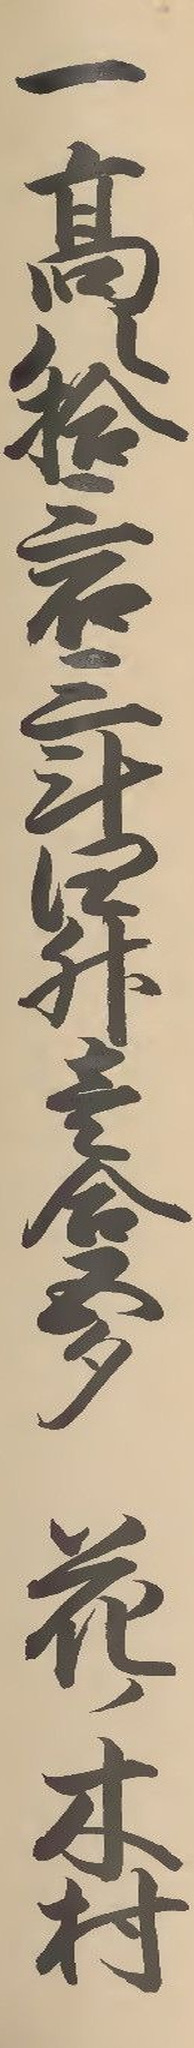一高八拾三石三斗四升壱合五勺花ノ木村
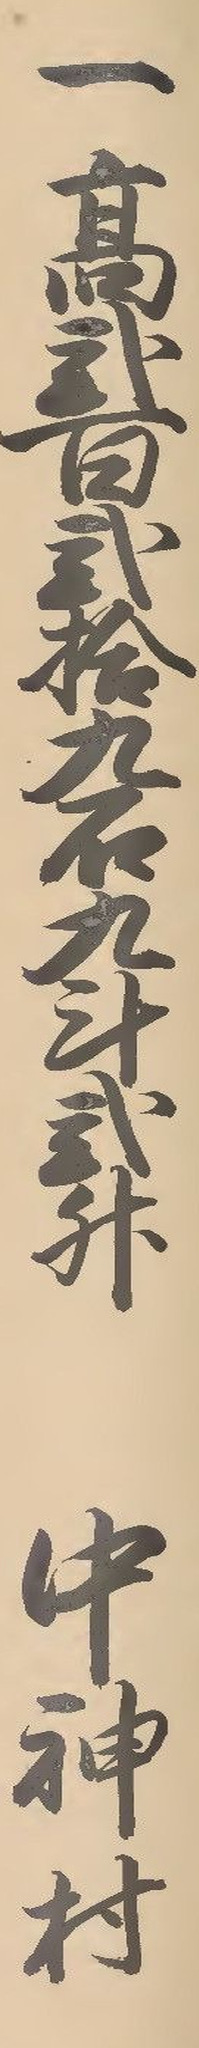一高弐百弐拾九石九斗弐升中神村
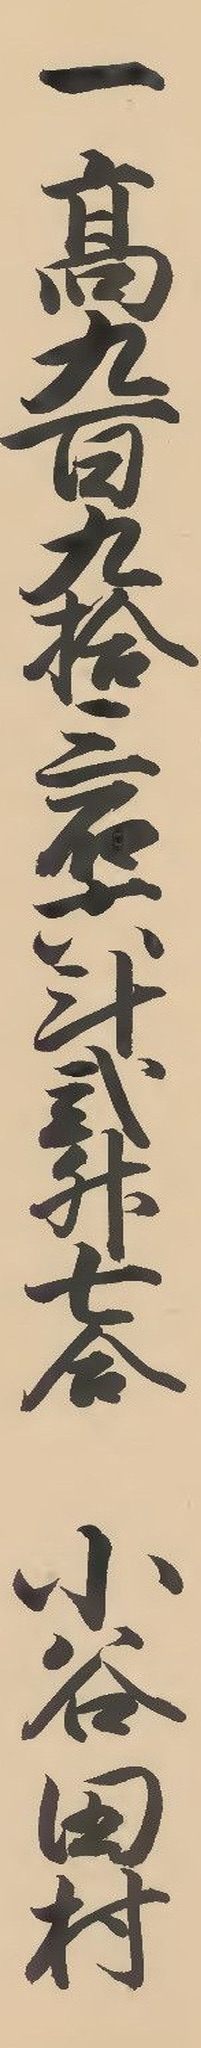一高九百九拾三石六斗弐升七合小谷田村
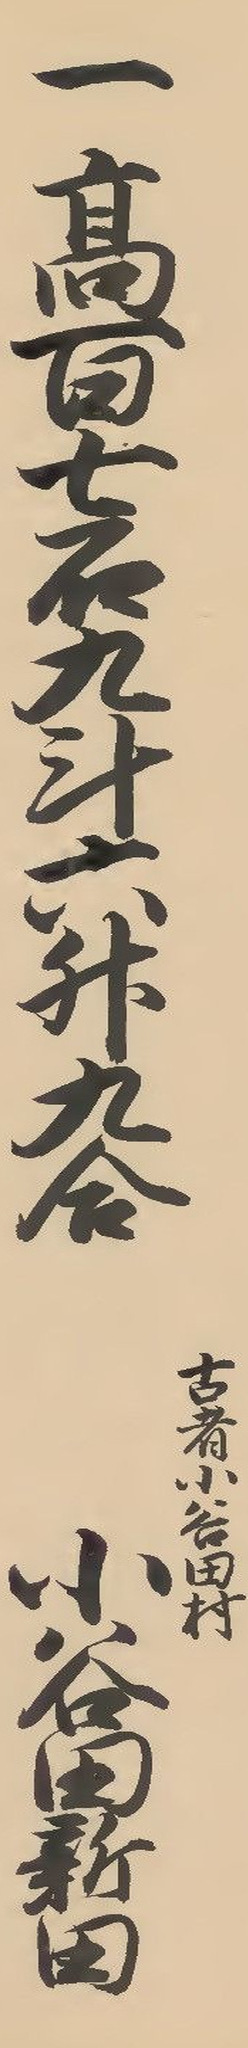一高百七石九斗六升九合小谷田新田
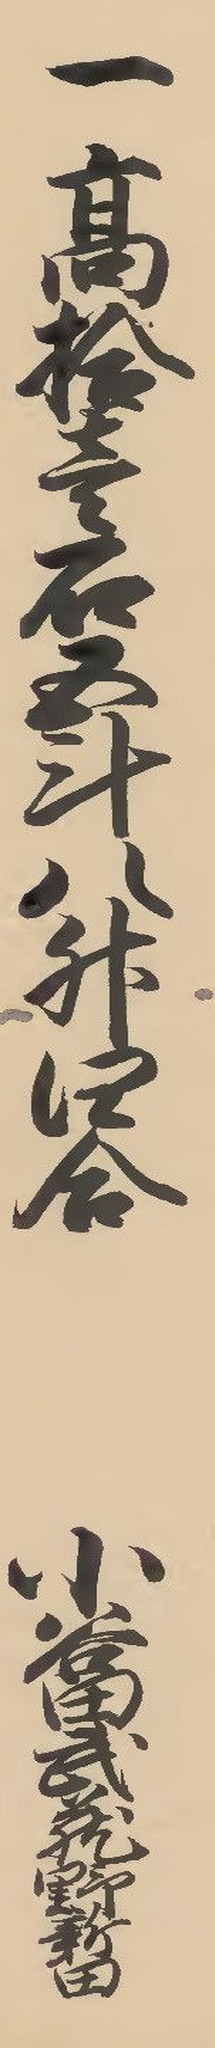一高拾壱石五斗八升四合小谷田武蔵野新田
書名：武蔵国郷帳　上
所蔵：国立公文書館 National Archives of Japan
